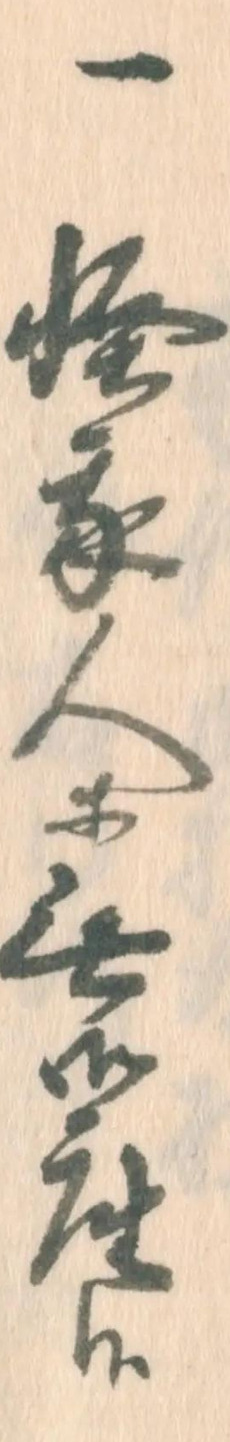一怪我人等無御座候

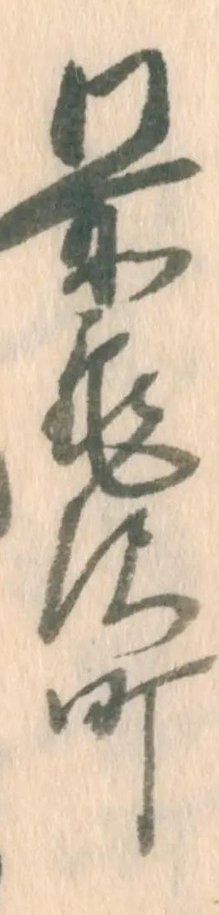同所亀沢町
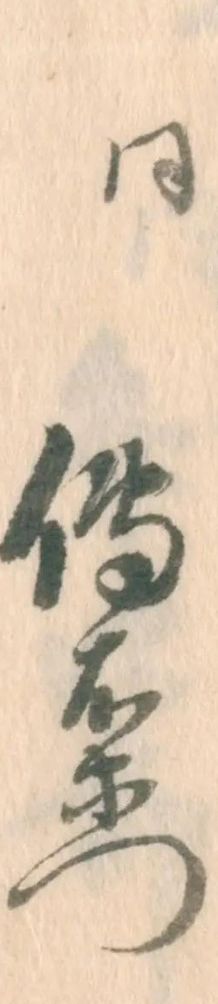同伝右衛門
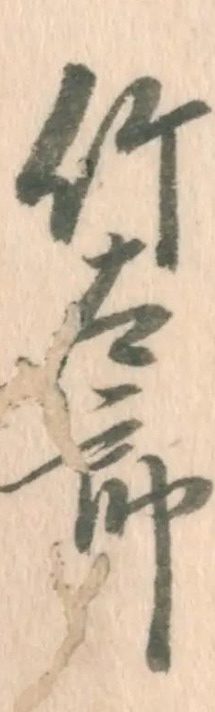竹太郎
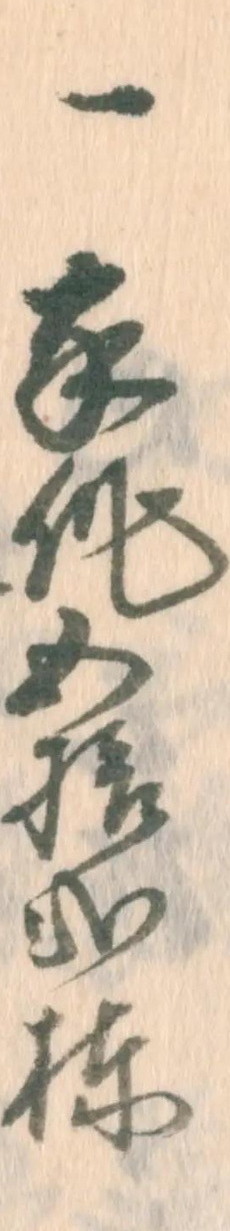一家作五拾弐棟
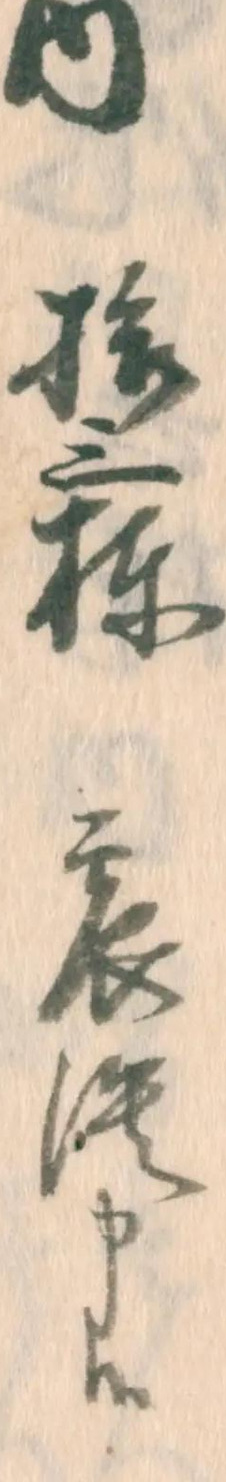内拾三棟震潰申候
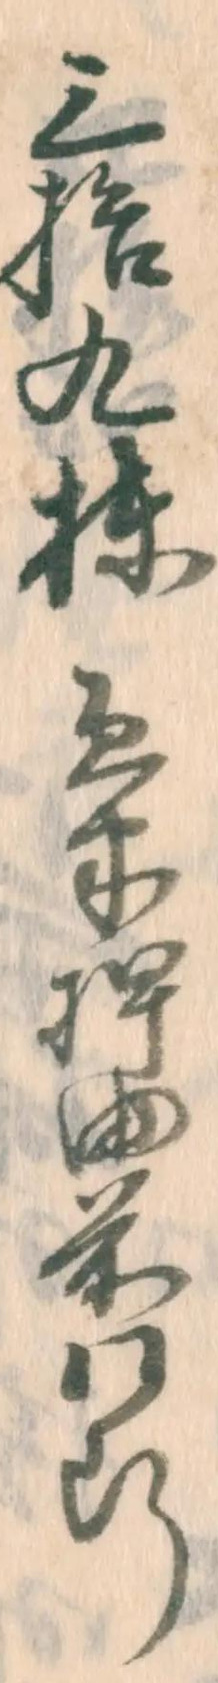三拾九弐棟過半押曲前同断
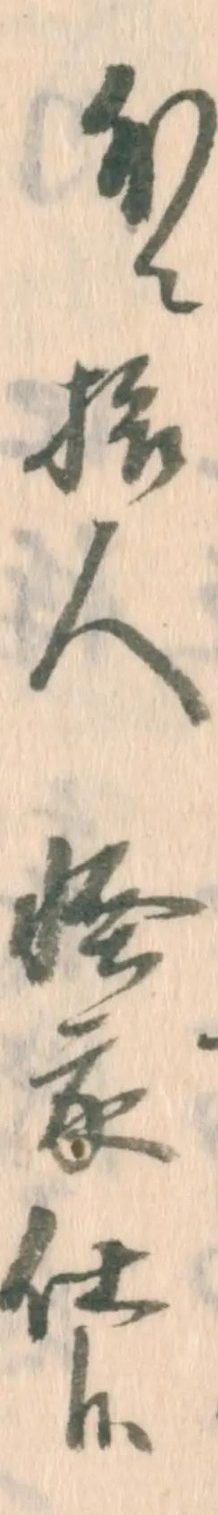外ニ拾人怪我仕候
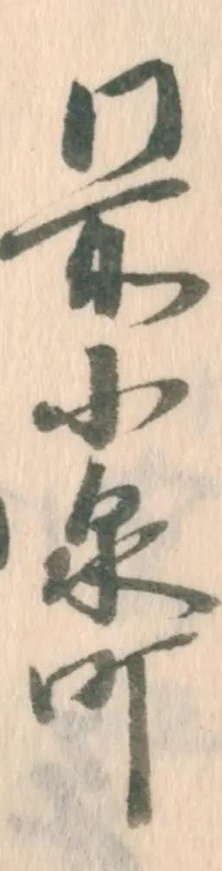同所小泉町
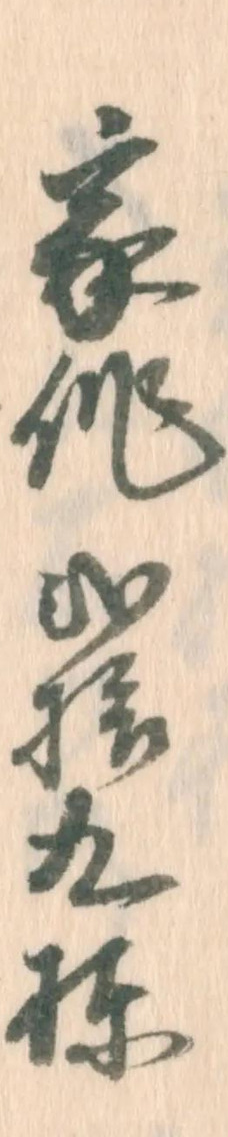一家作弐拾九棟
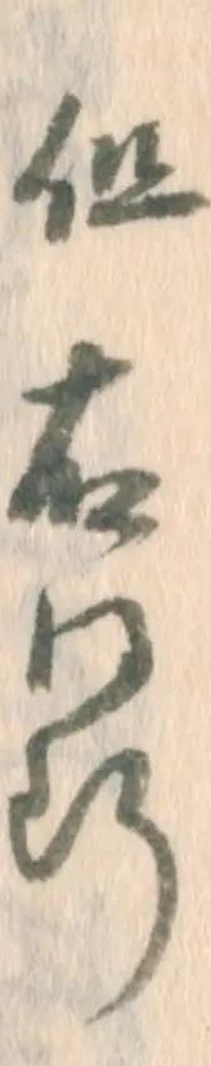但右同断
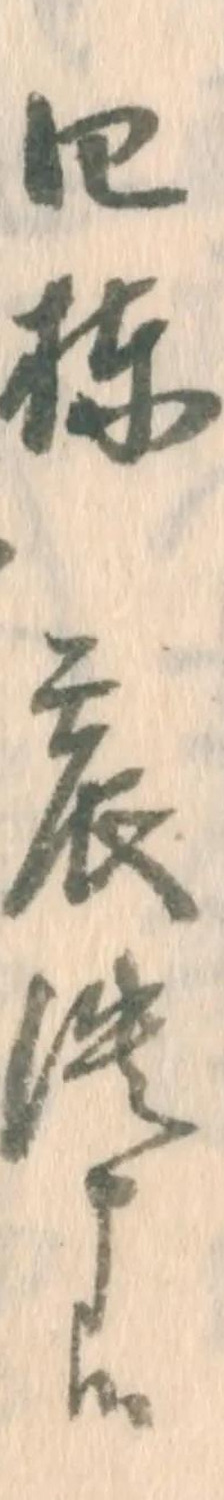内四棟震潰申候
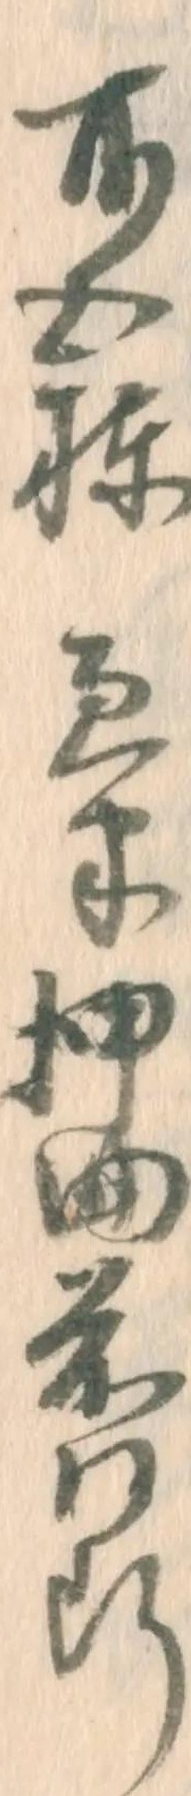廿五棟過半押曲前同断

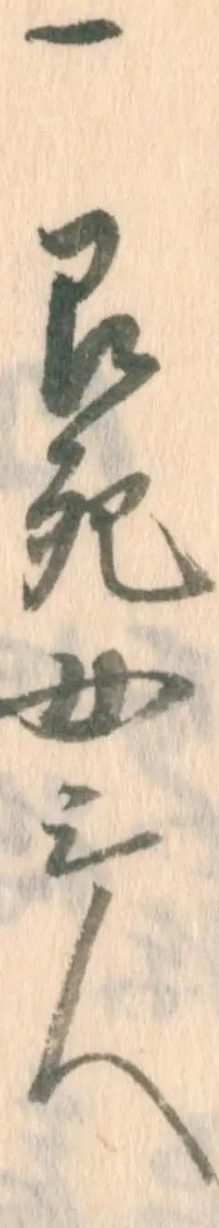一即死女三人
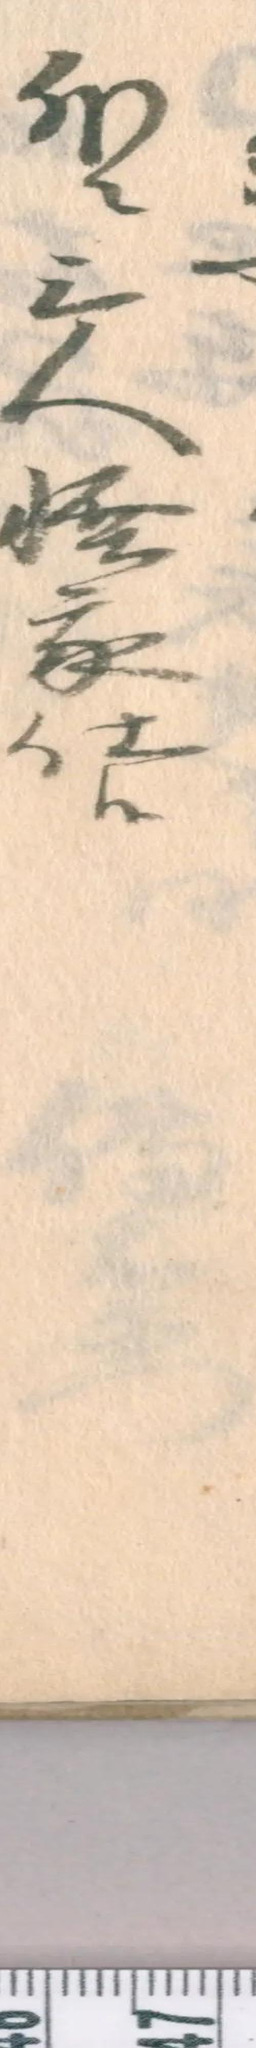外ニ三人怪我仕候
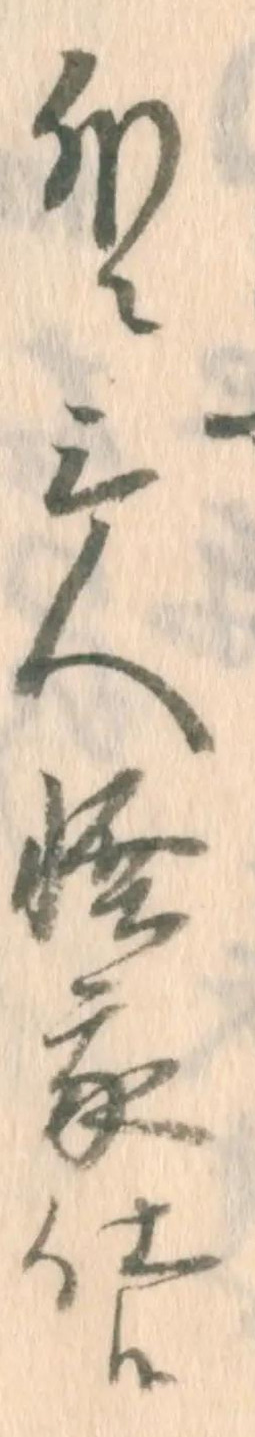外ニ三人怪我仕候
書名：地震災書留 2巻. [1] 内表紙に「地震災書留　安政二卯年　但本所深川御用屋敷地代免除調」とあり
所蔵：国立国会図書館 National Diet Library, JAPAN
